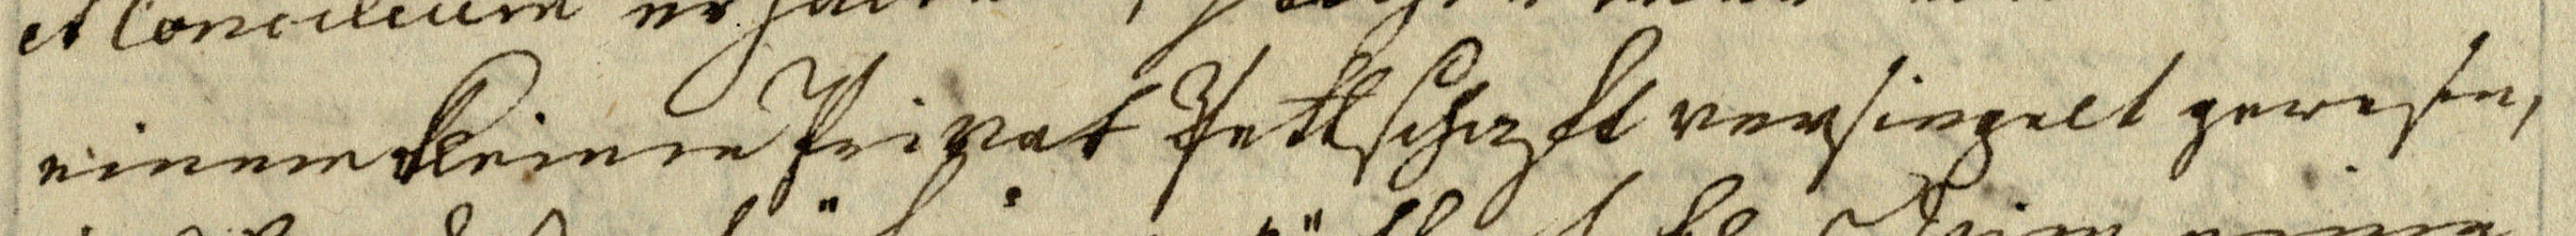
einem kleinen Privat Pettschaft versiegelt gewesen,
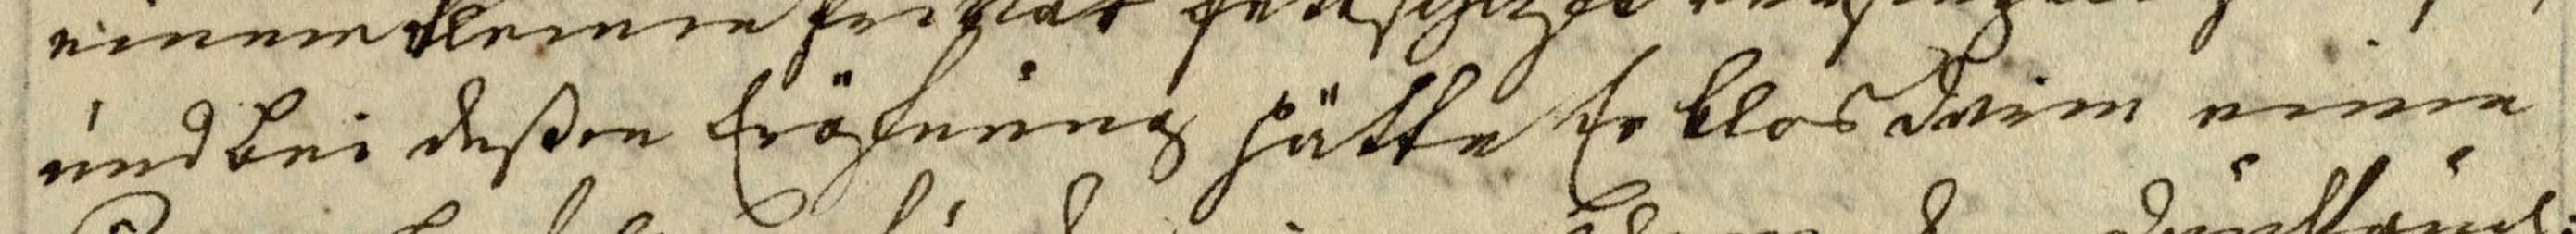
und bei deßen Eröfnung hätte Er blos darin einen
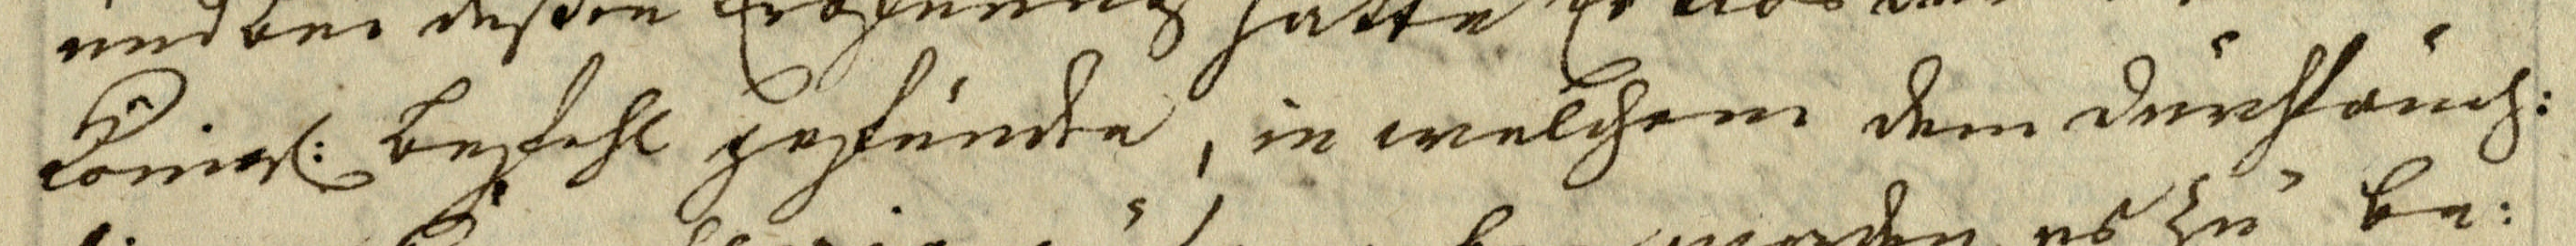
Königl. Befehl gefunden, in welchem dem durchlauch¬
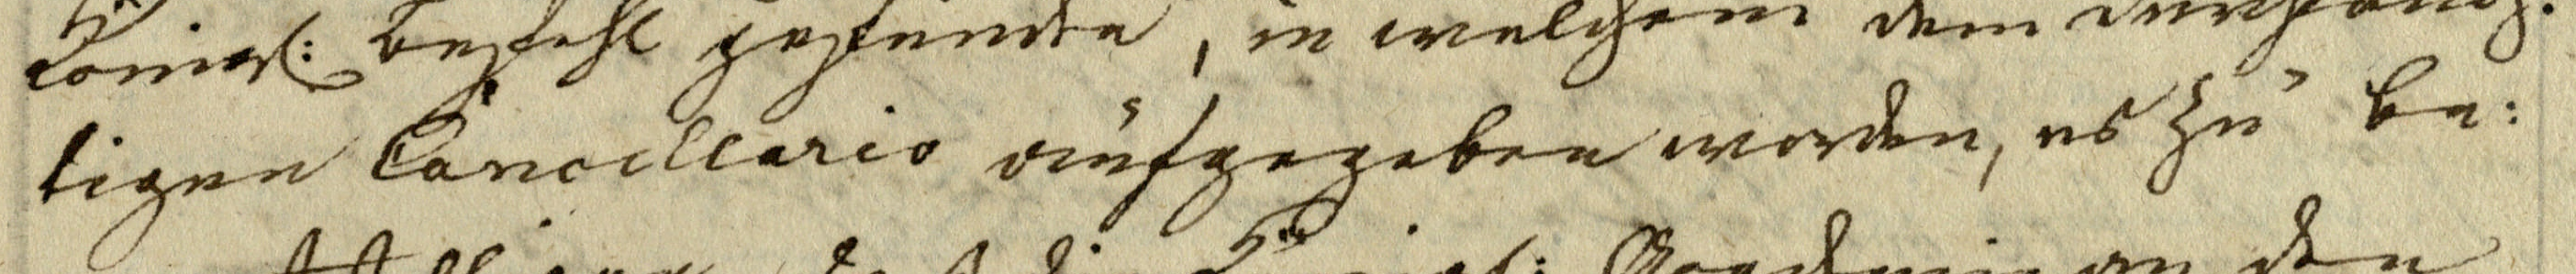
tigen Cancellario aufgegeben worden, es zu be¬
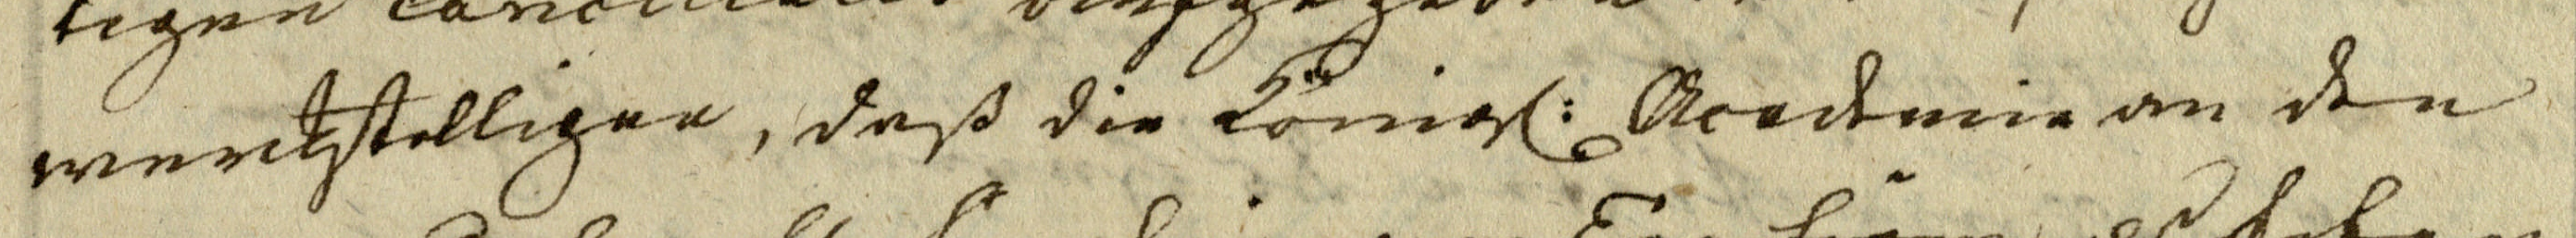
werckstelligen, daß die Königl. Academie an den
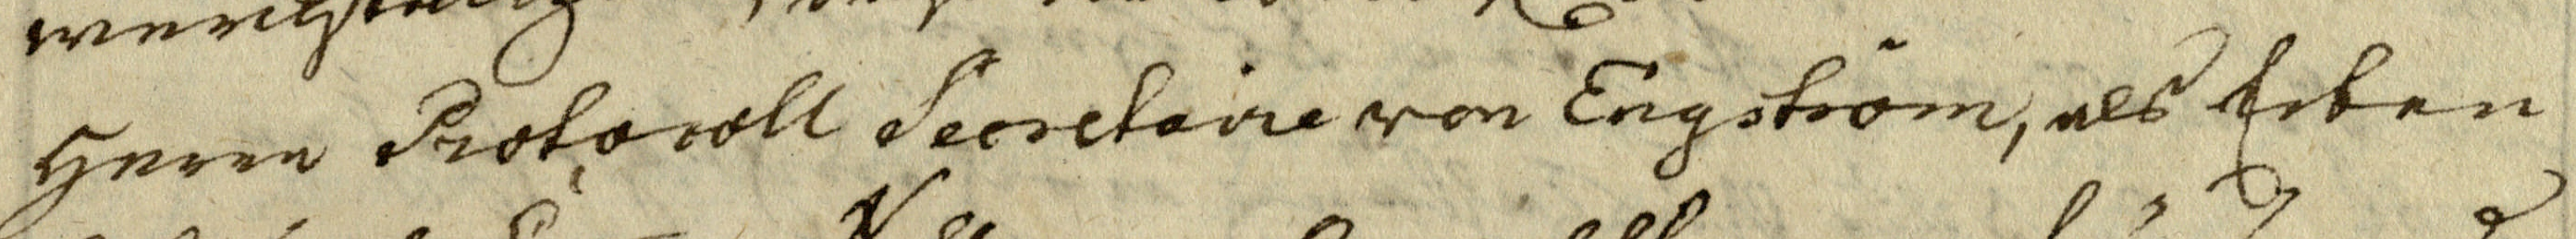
Herrn Protocoll Secretaire von Engström, als Erben
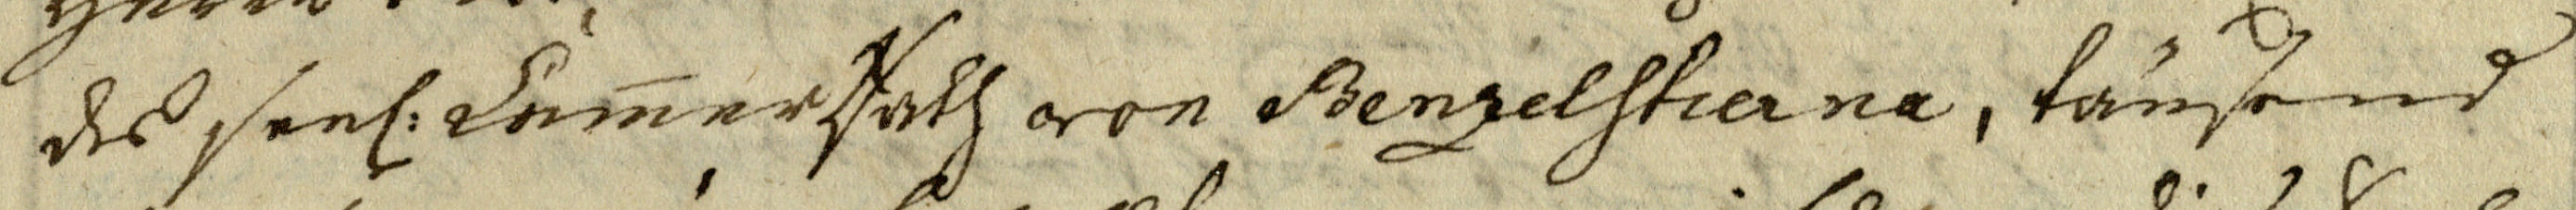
des seel. CamerRath von Benzelstierna, tausend
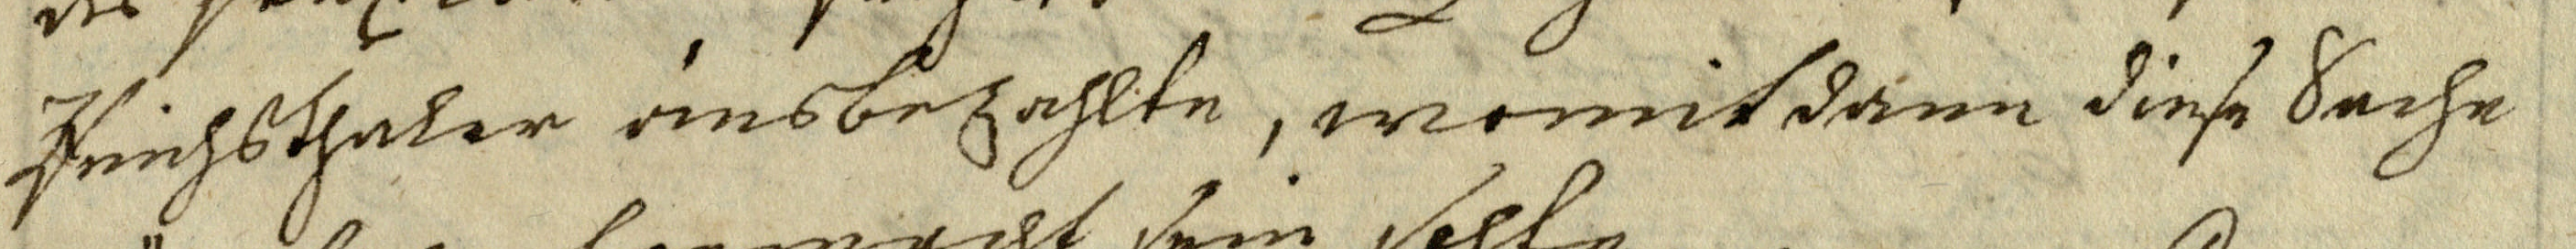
Reichsthaler ausbezahlte, womit dann diese Sache
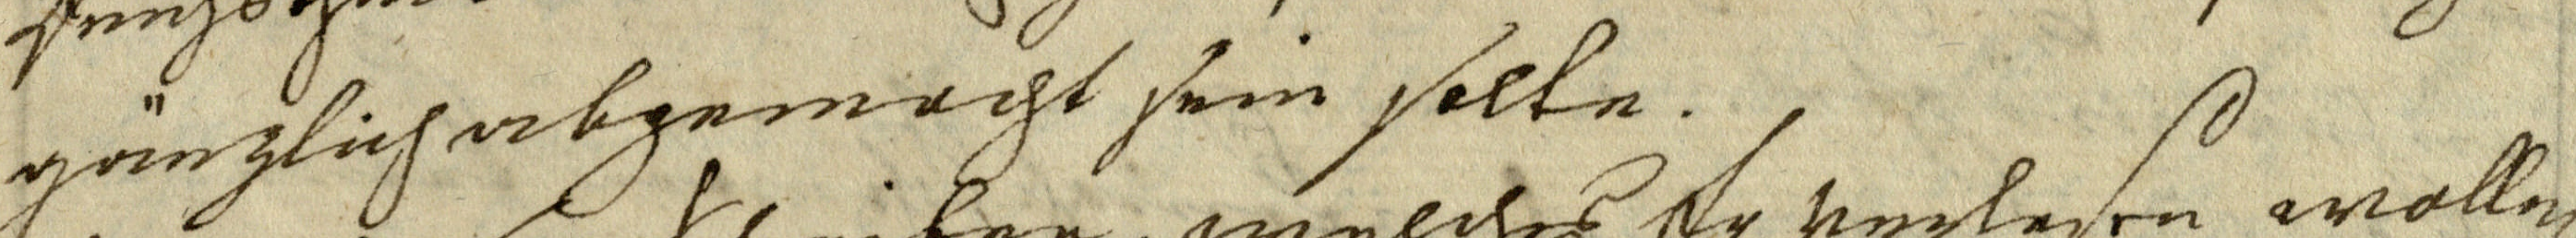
gänzlich abgemacht sein solte.
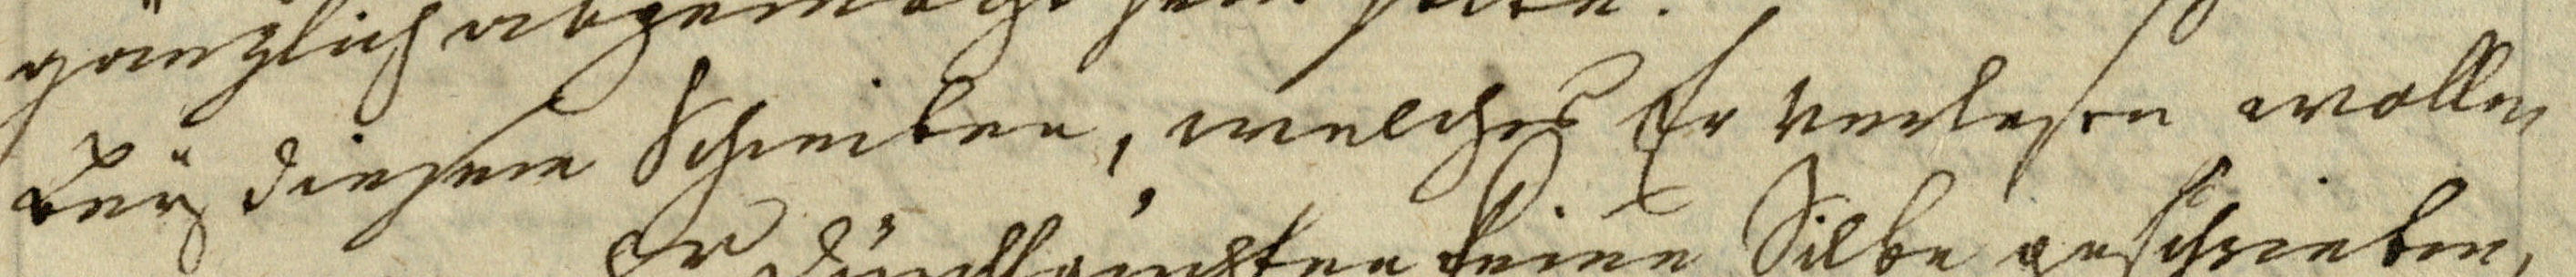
Beÿ diesem Schreiben, welches Er verlesen wolle,
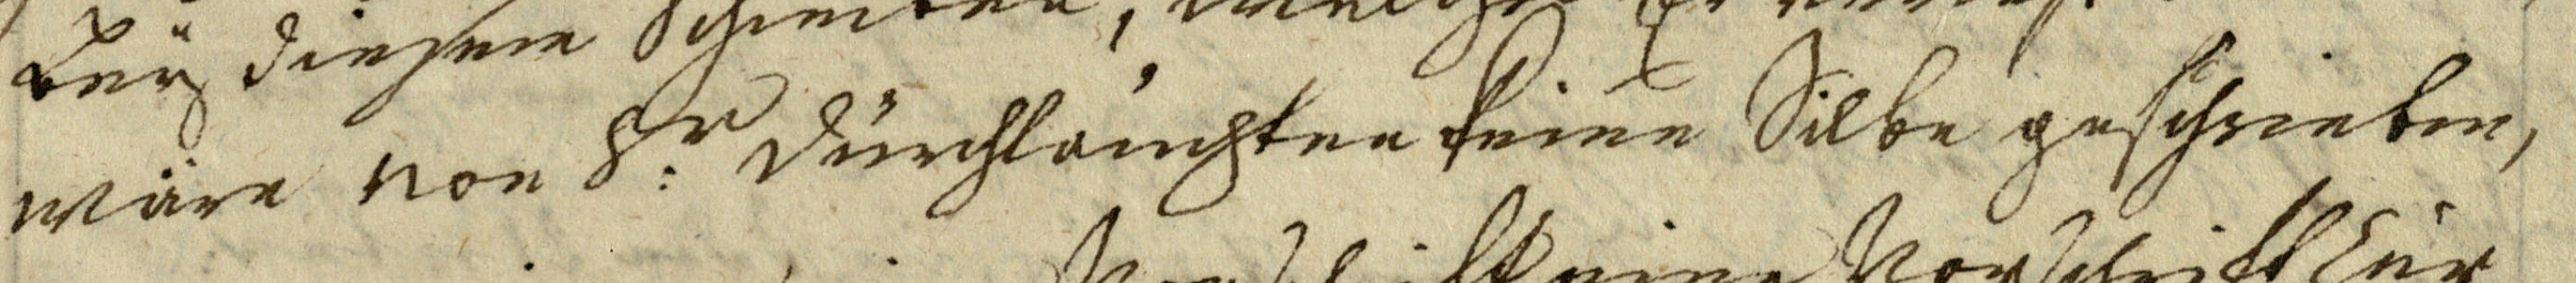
wäre von Sr. Durchlauchten keine Silbe geschrieben,
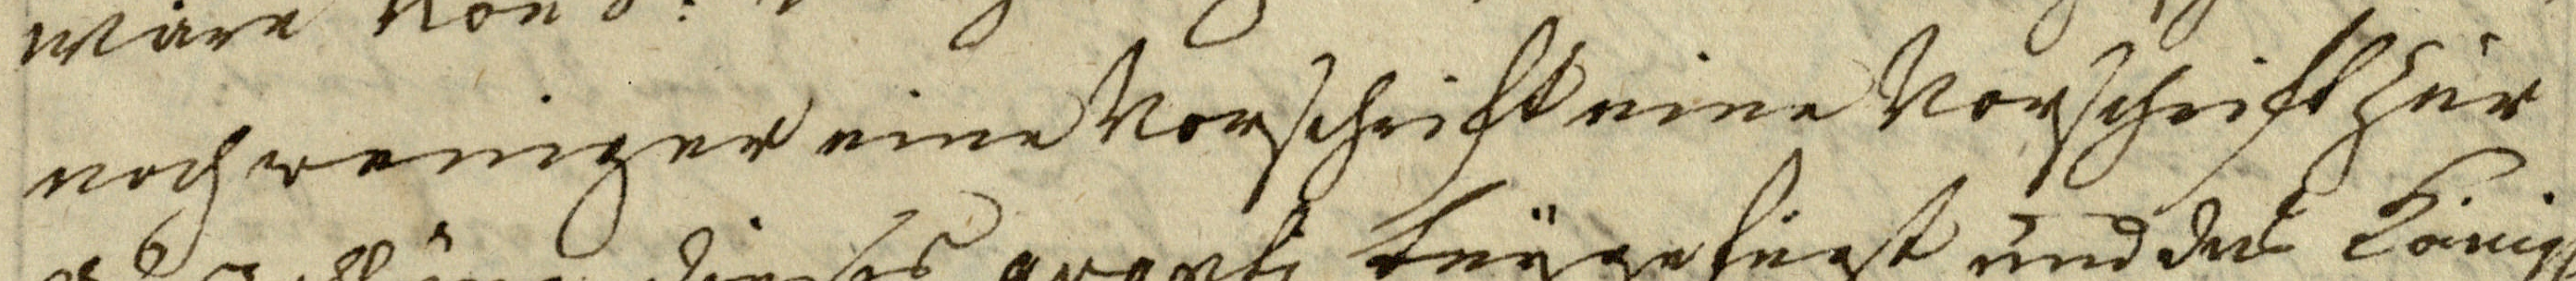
noch weniger eine Vorschrift eine Vorschrift zur
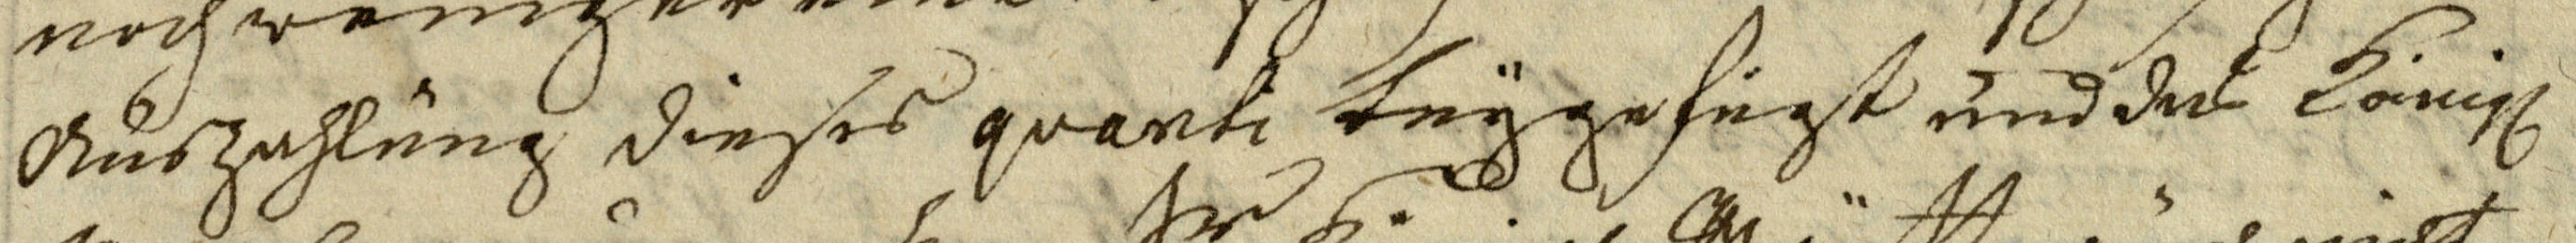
Auszahlung dieses quanti beÿgefügt und das Königl.
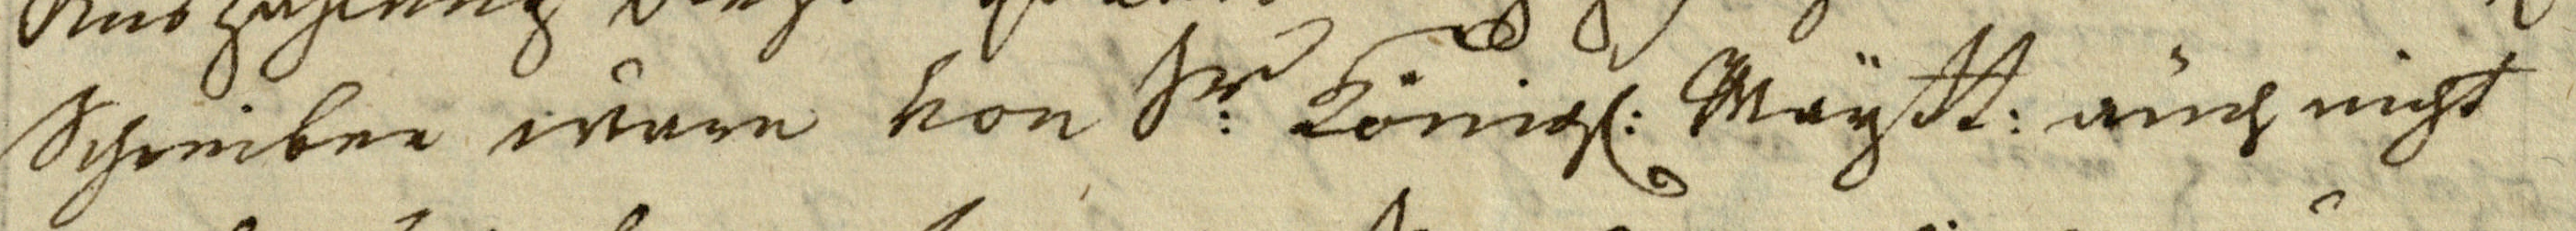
Schreiben wäre von Sr Königl. Maÿtt. auch nicht
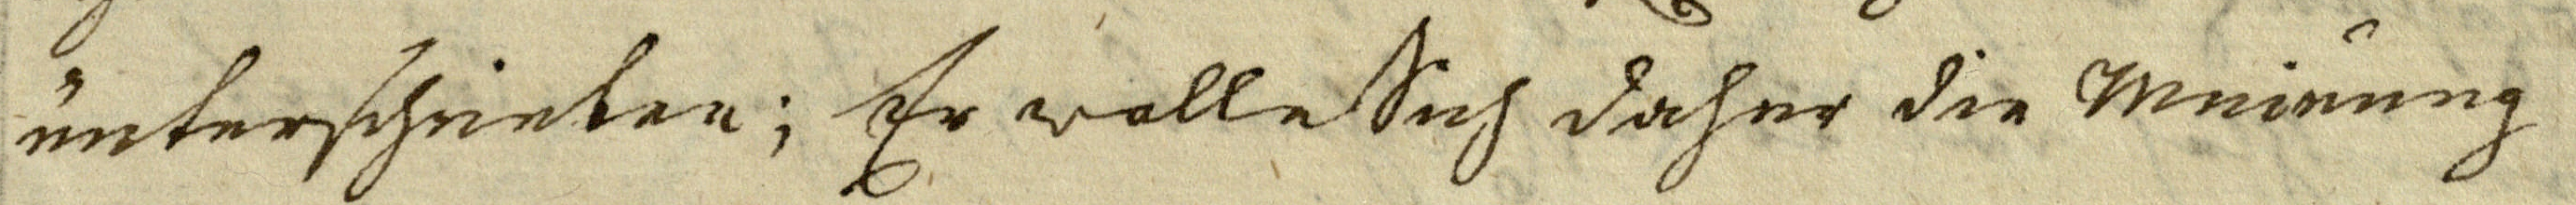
unterschrieben; Er wolle Sich daher die Meinung
